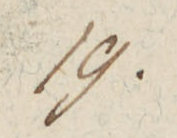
19.
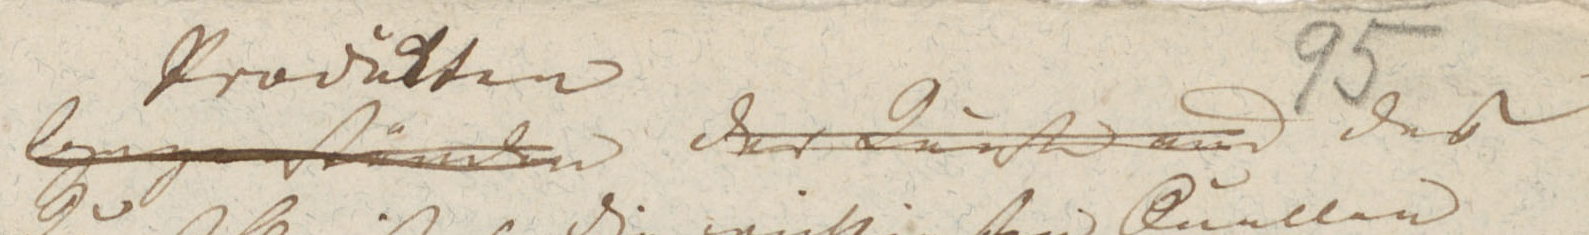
Gegenständen Produkten der Kunst und des
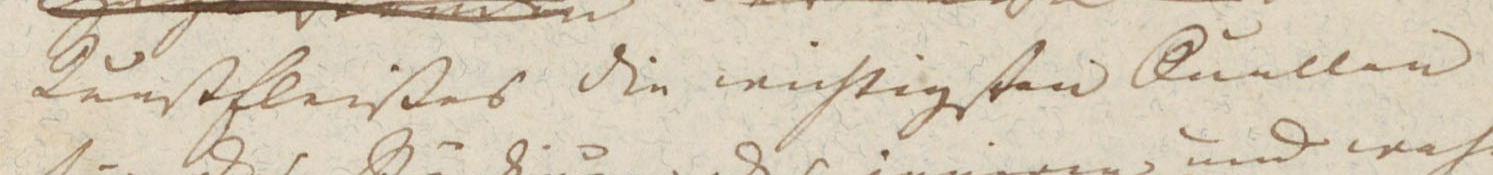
Kunstfleisses die wichtigsten Quellen
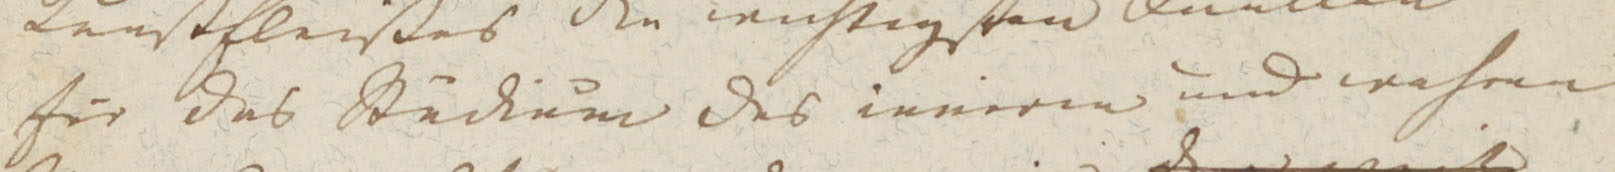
für das Studium des inneren und wahren
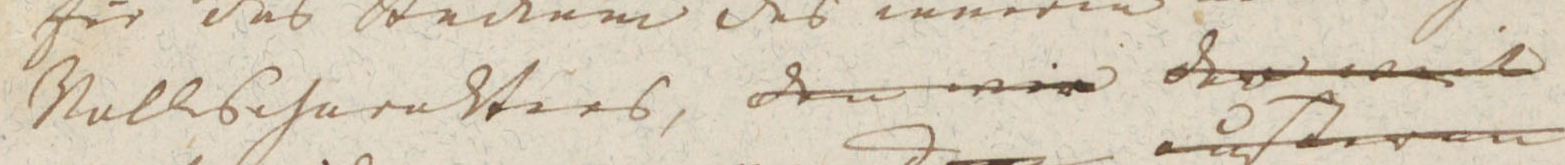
Volkscharakters, dem wir der mit
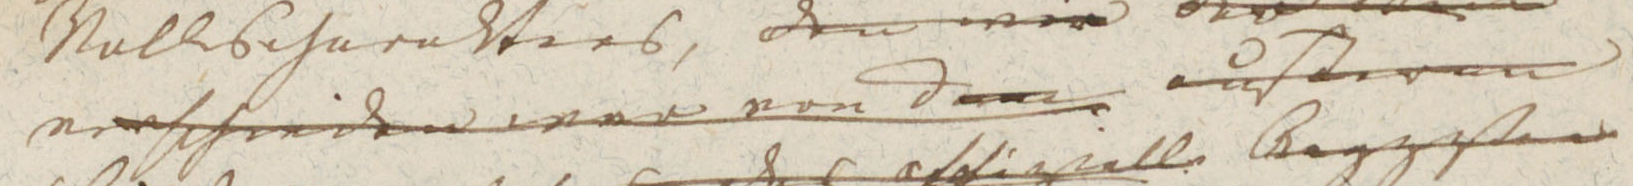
verschieden war von dem ausseren
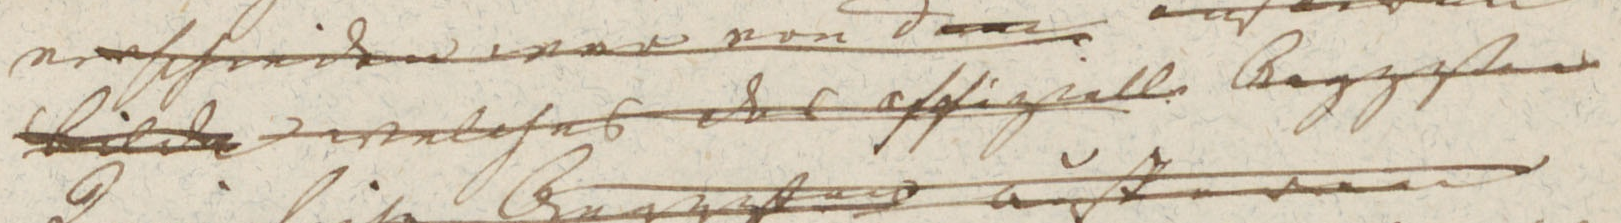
Bilde welches das offizielle Aegypten
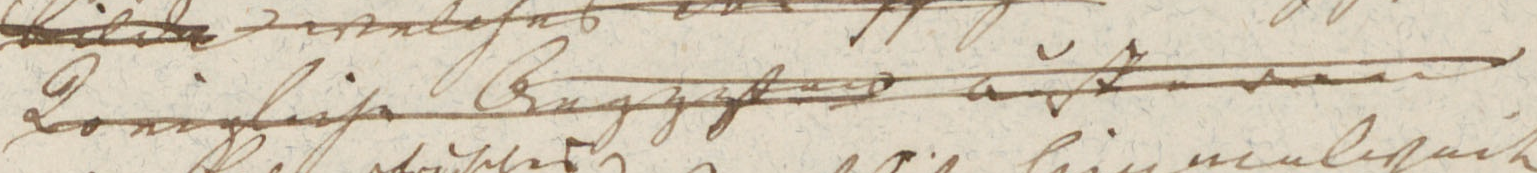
Konigliche Aegypten ausseren
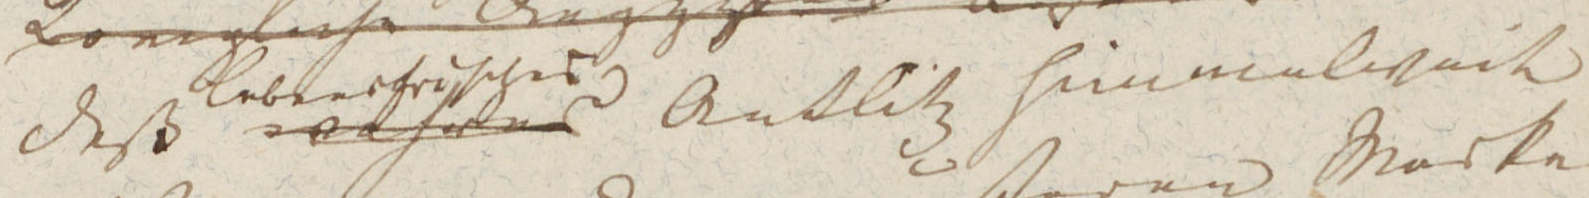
dass wahres lebensfrisches Antlitz himmelweit
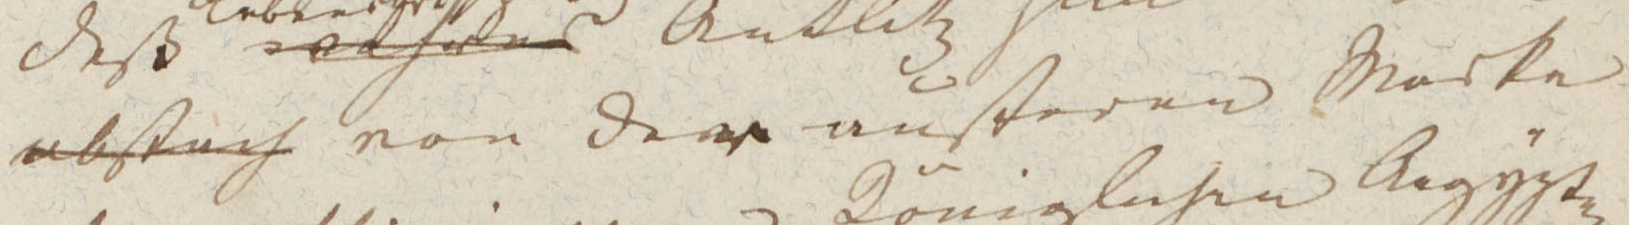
abstach von demr ausseren Marke
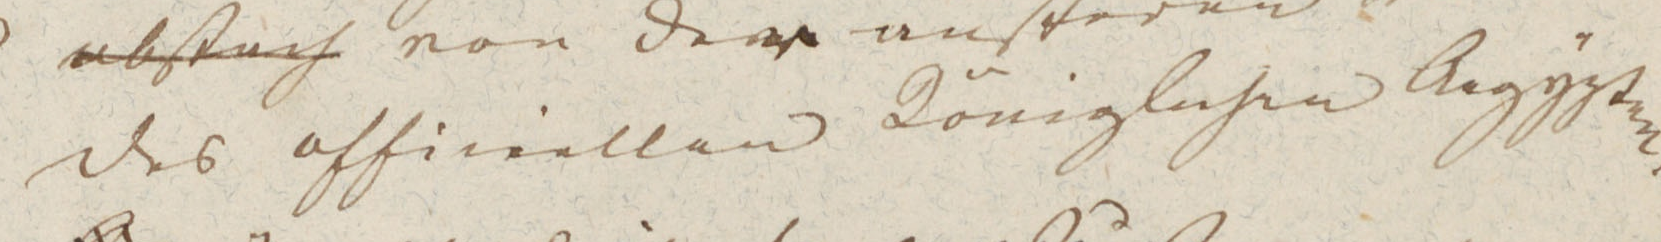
des officiellen Königlichen Aegypten.
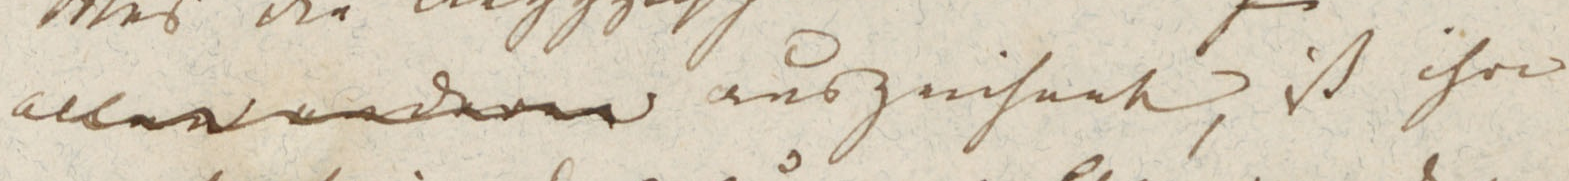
allen anderen auszeichnet, ist ihre
